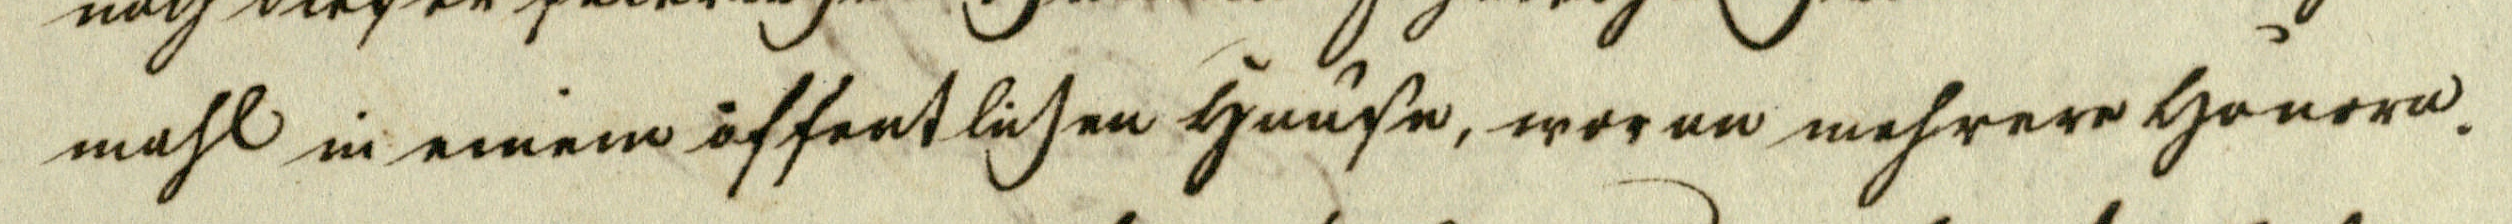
mahl in einem öffentlichen Hause, woran mehrere Honora¬
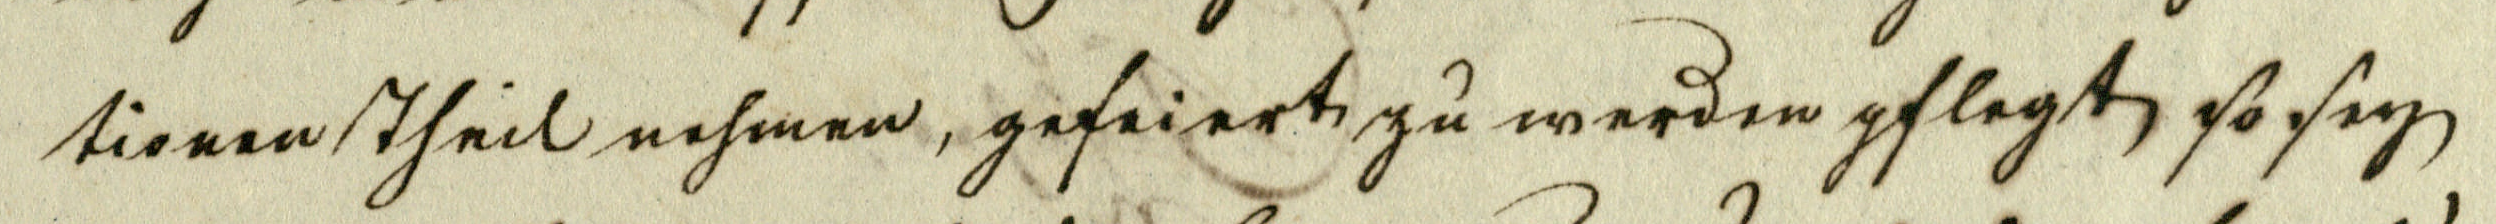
tionen Theil nehmen, gefeiert zu werden pflegt, so sey
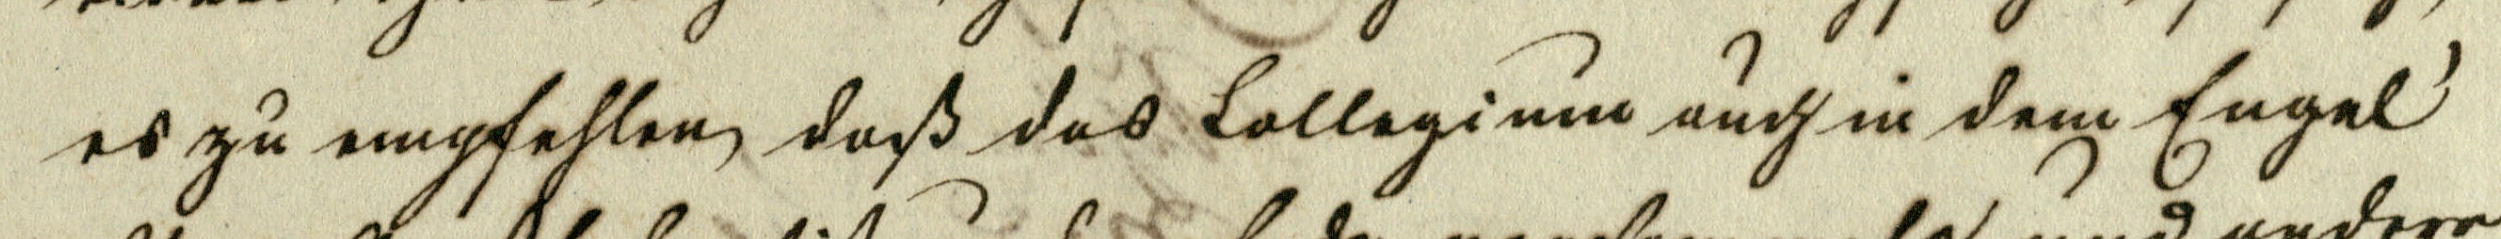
es zu empfehlen, daß das Collegium auch in dem Engel'
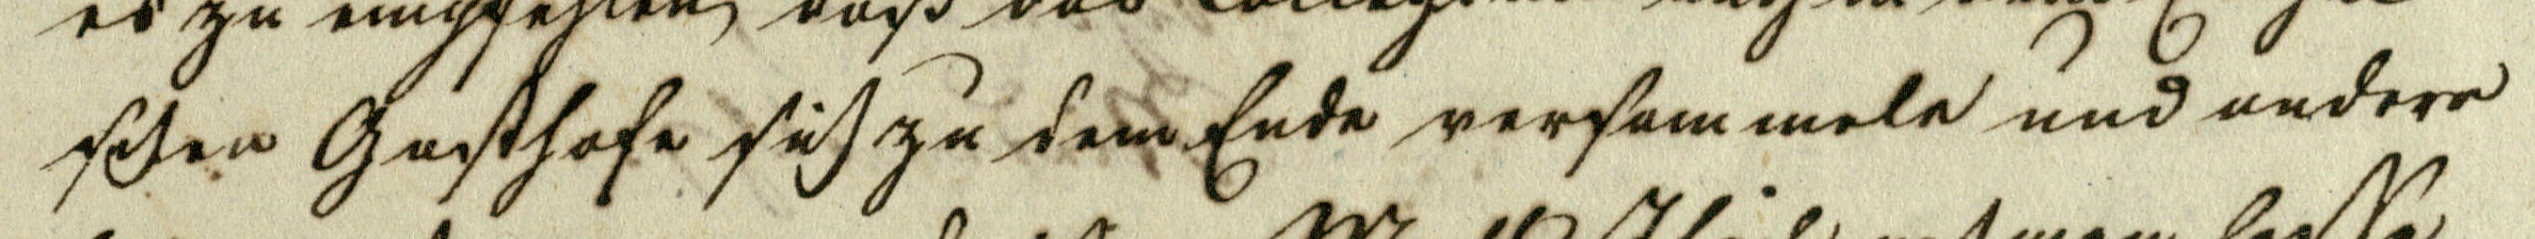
schen Gasthofe sich zu dem Ende versammele und andere
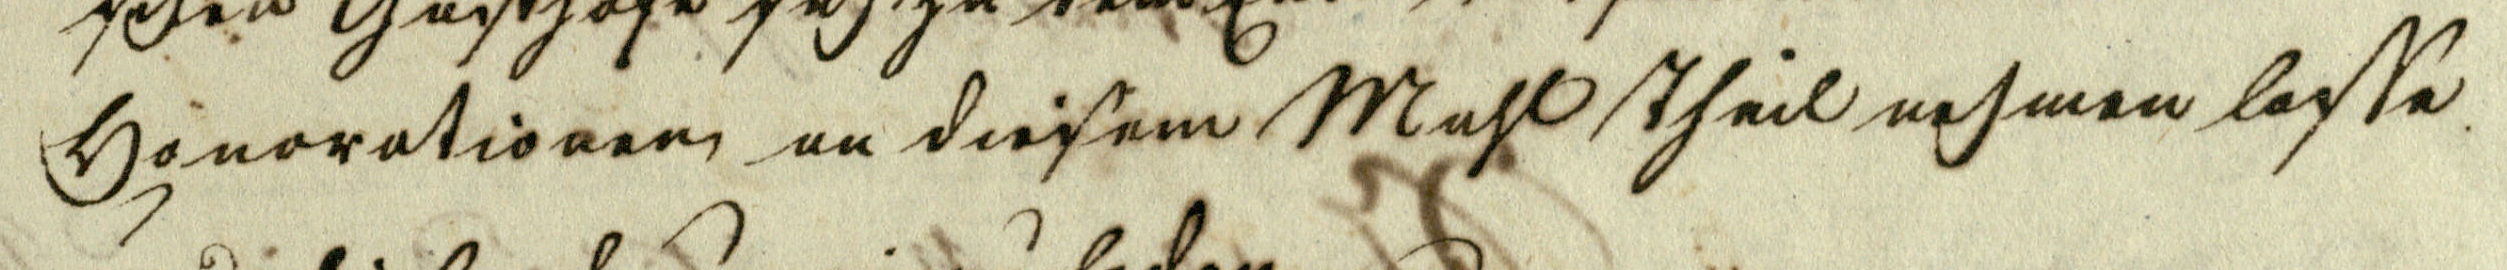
Honorationen, an diesem Mahl Theil nehmen lasse
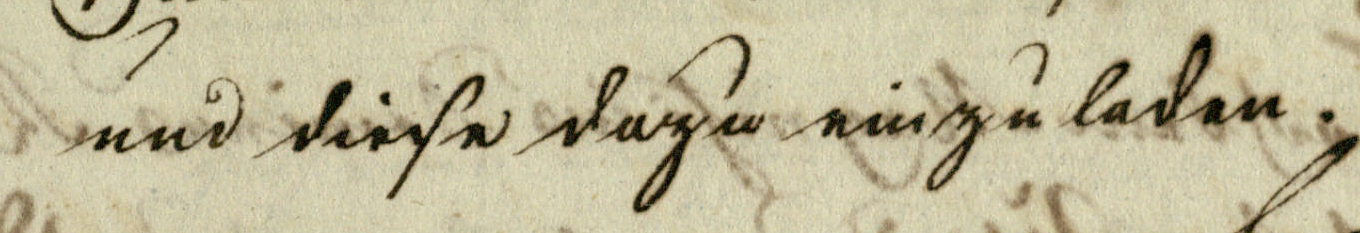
und diese dazu einzuladen.
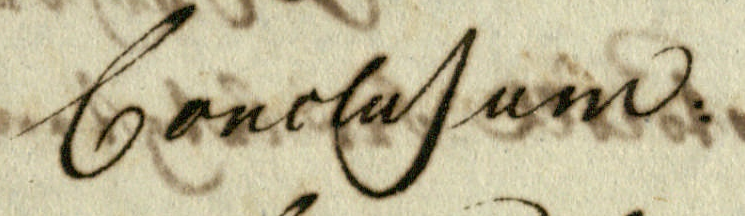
Conclusum:
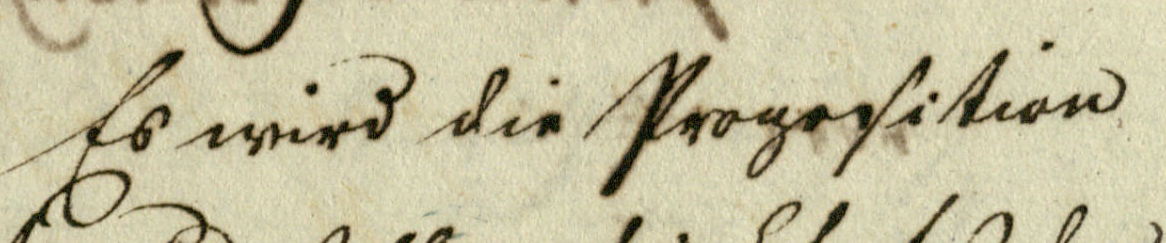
Es wird die Proposition
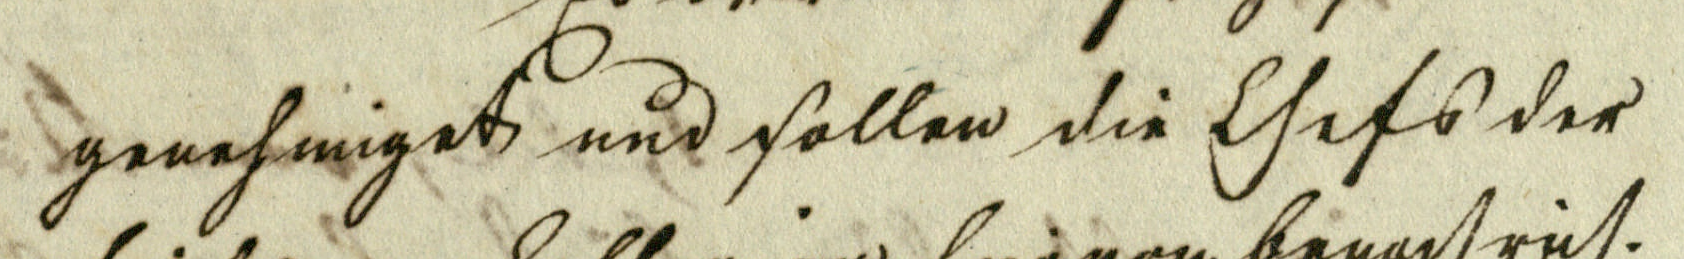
genehmiget und sollen die Chefs der
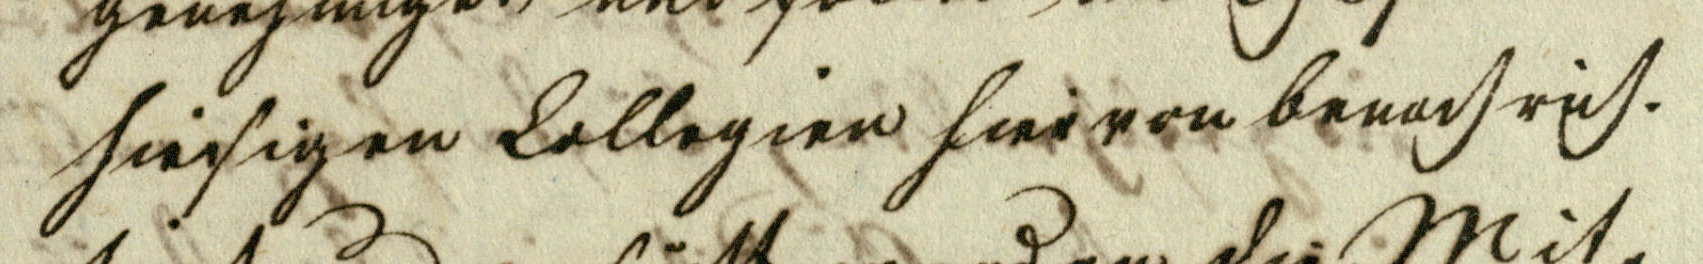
hiesigen Collegien hievon benachrich¬
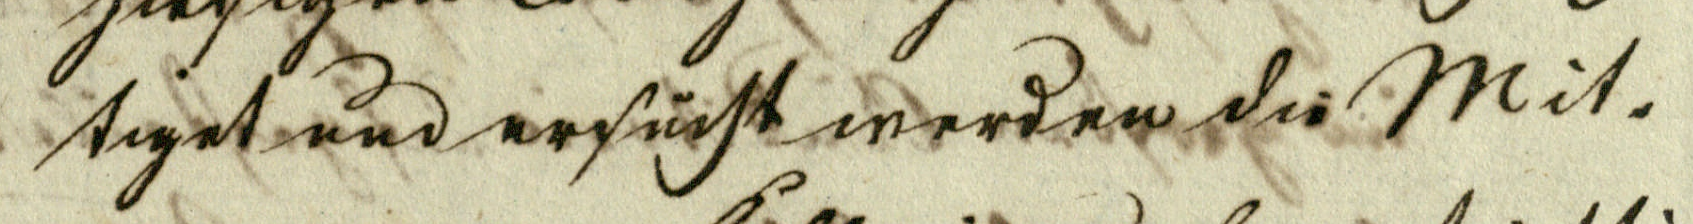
tiget und ersucht werden die Mit¬
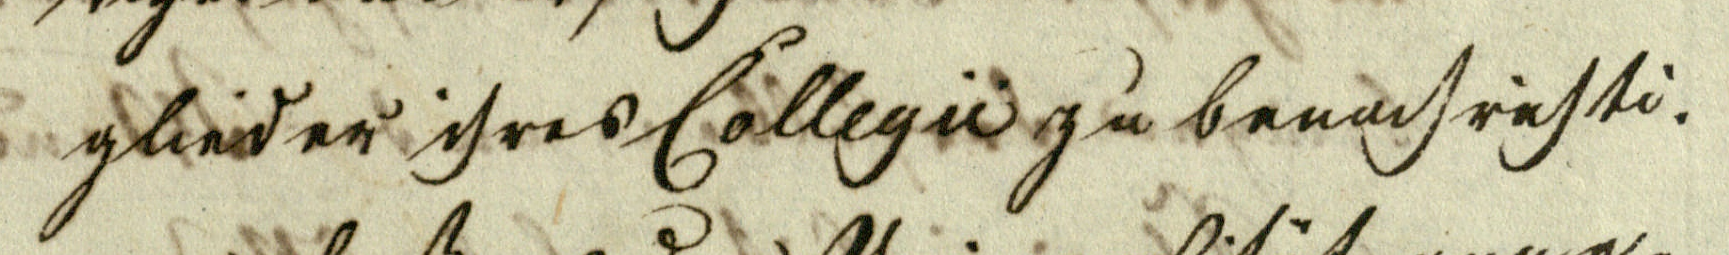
glieder ihres Collegii zu benachrichti¬
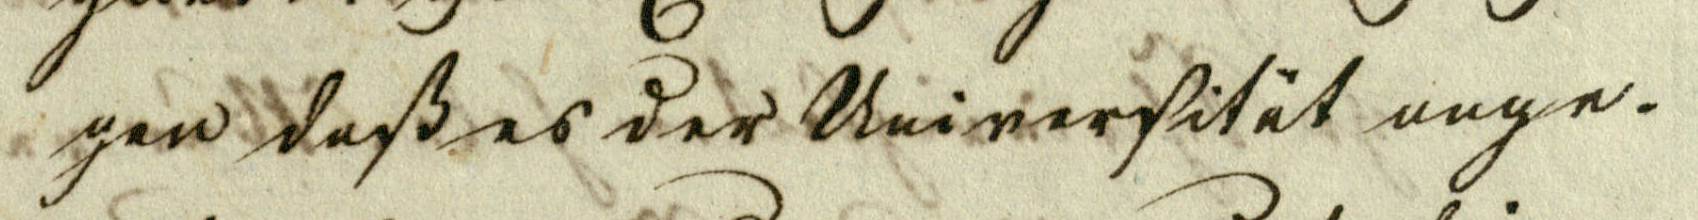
gen daß es der Universität ange¬
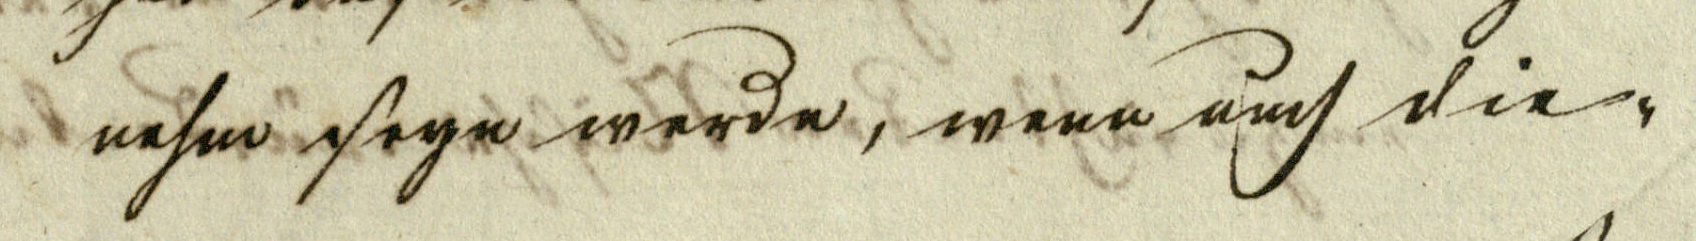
nehm seyn werde, wenn auch die¬
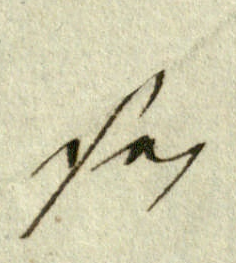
se
